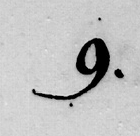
3.
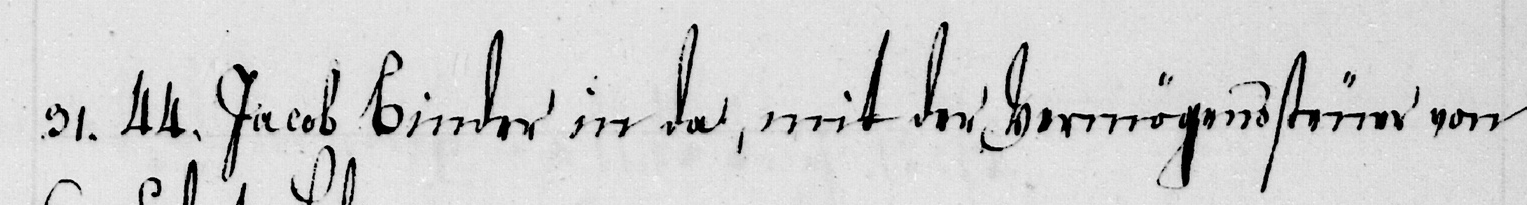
31. 44. Jacob Binder in da, mit der Vermögenssteuer von
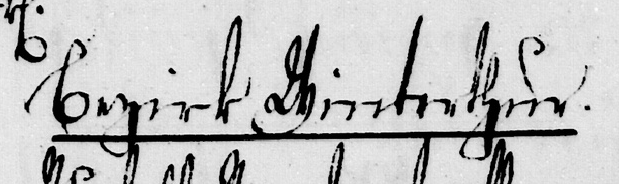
Bezirk Winterthur.
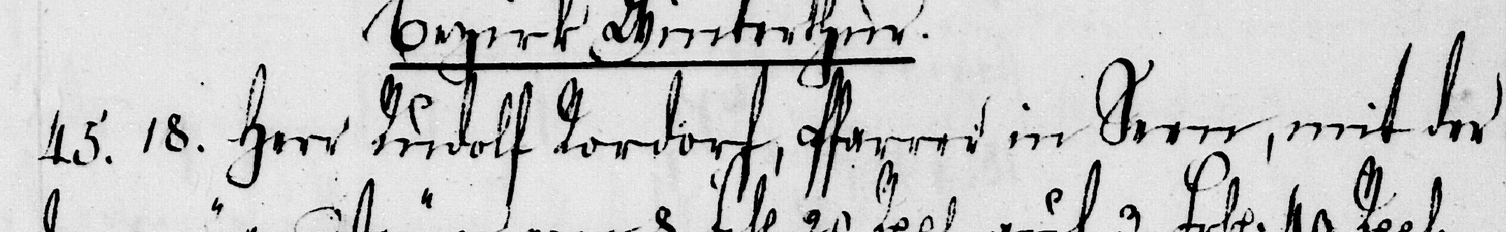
45. 18. Herr Rudolf Rordorf, Pfarrer in Seen, mit der
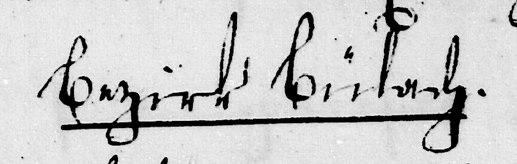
Bezirk Bülach.
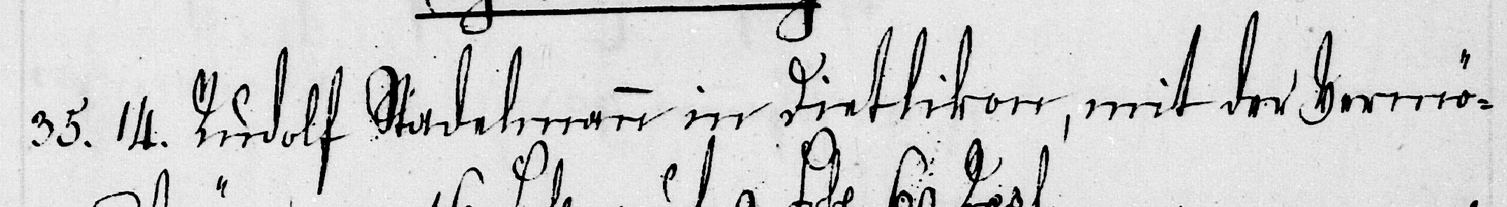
35. 14. Rudolf Stadelmann in Dietlikon, mit der Vermö¬
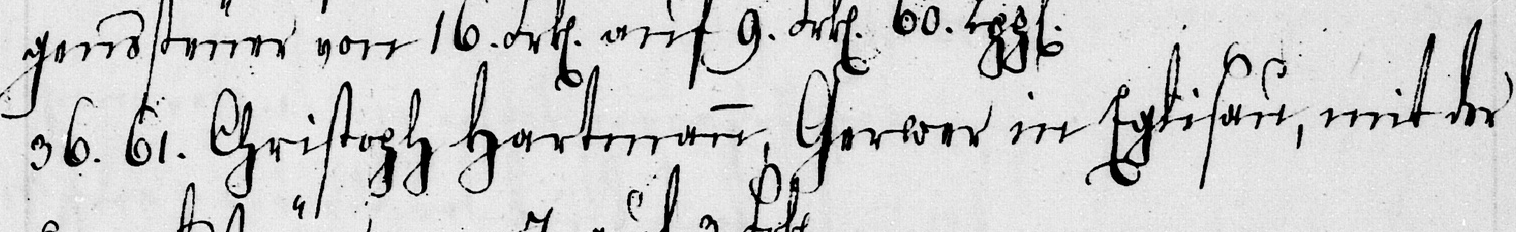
36. 61. Christoph Hartmann, Gerwer in Eglisau, mit der
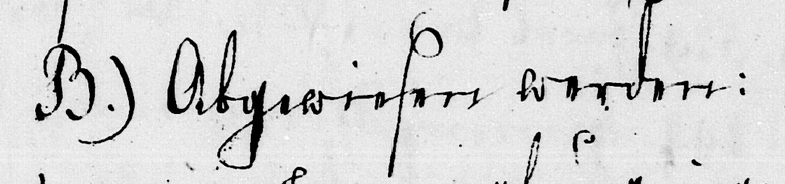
B.) Abgewiesen werden:
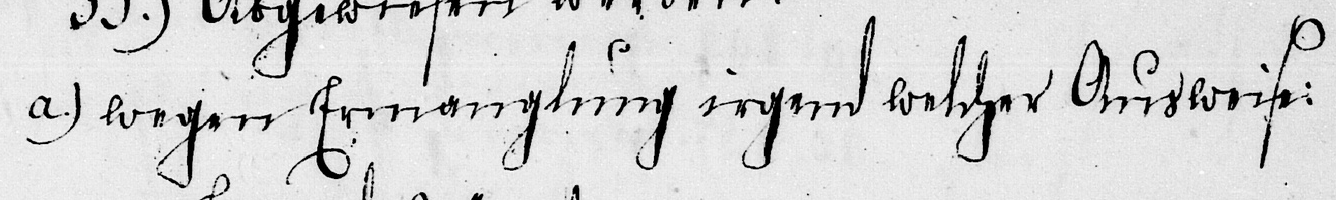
a.) wegen Ermanglung irgend welcher Ausweise:
